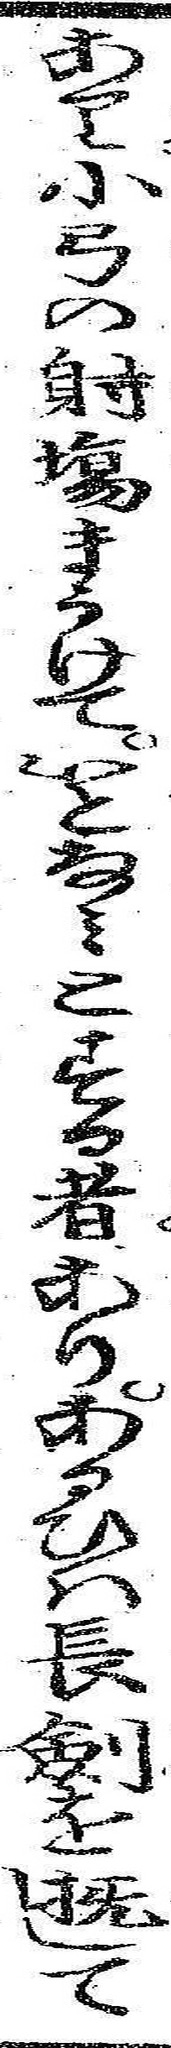あり。小弓の射場まうけて。いとなみとする者あり。あるひは長剣を撫して
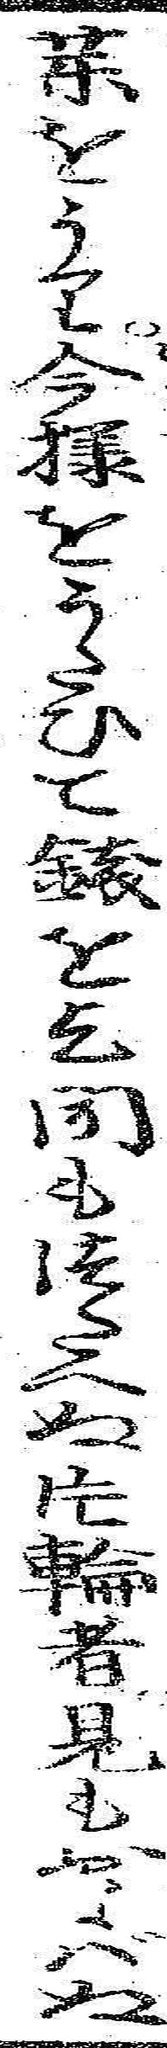薬をうり。今様をうたひて銭を乞聞もつたへぬ片輪者。見もおよばぬ
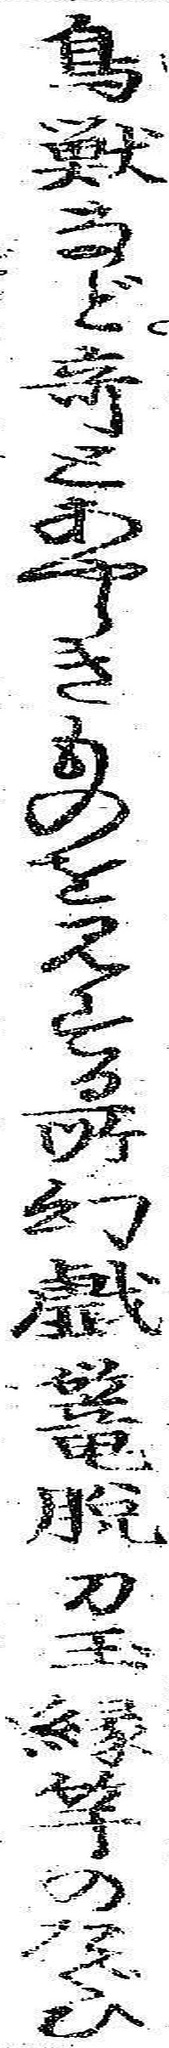鳥獣など。奇とあやしきものを見する所幻戯篭脱刀玉縁竿のたぐひ
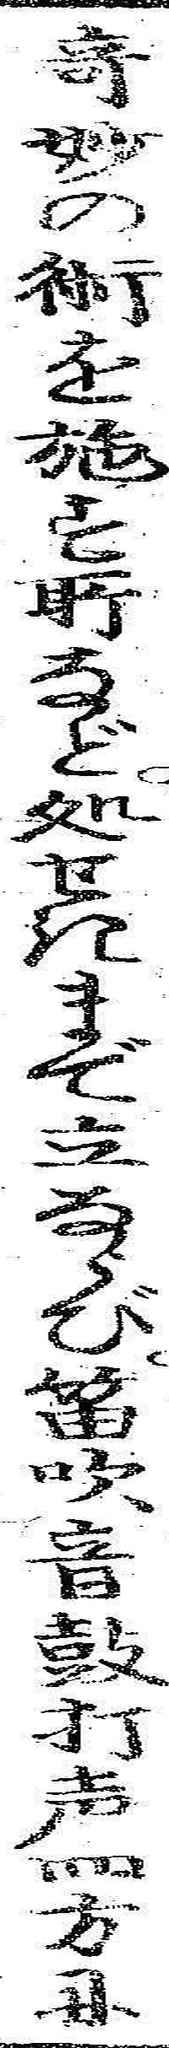奇妙の術を施す所など。処せきまで立ならび。笛吹音鼓打声四方に
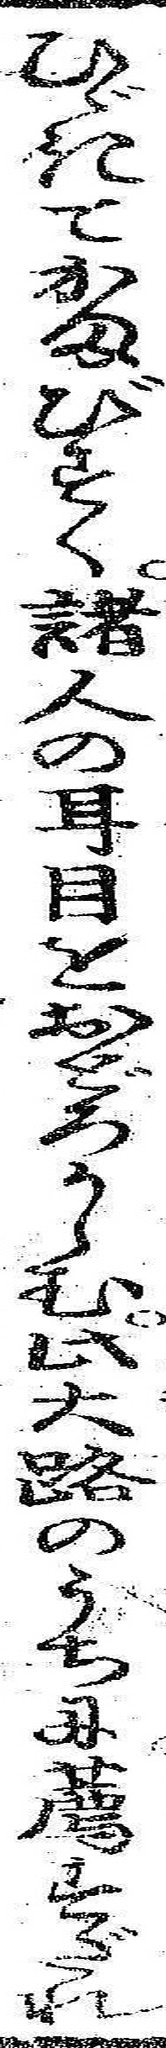ひゞきてかまびすく。諸人の耳目をおどろかしむ。此大路のうちに。薦すだれ
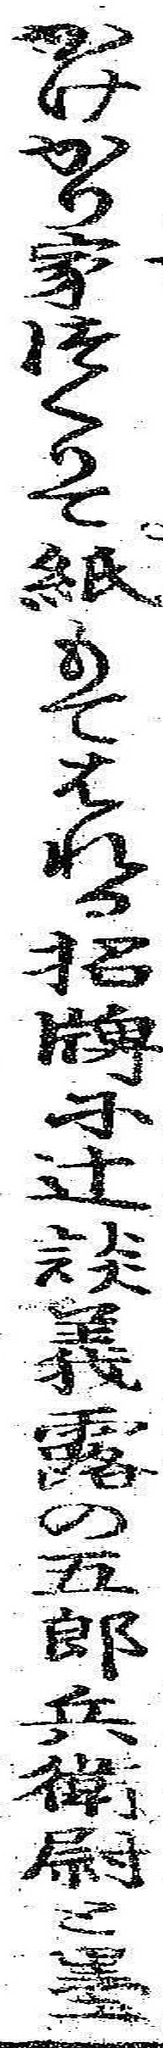かけかり家つくりて。紙もてはれる招牌に。辻談義露の五郎兵衛尉と墨
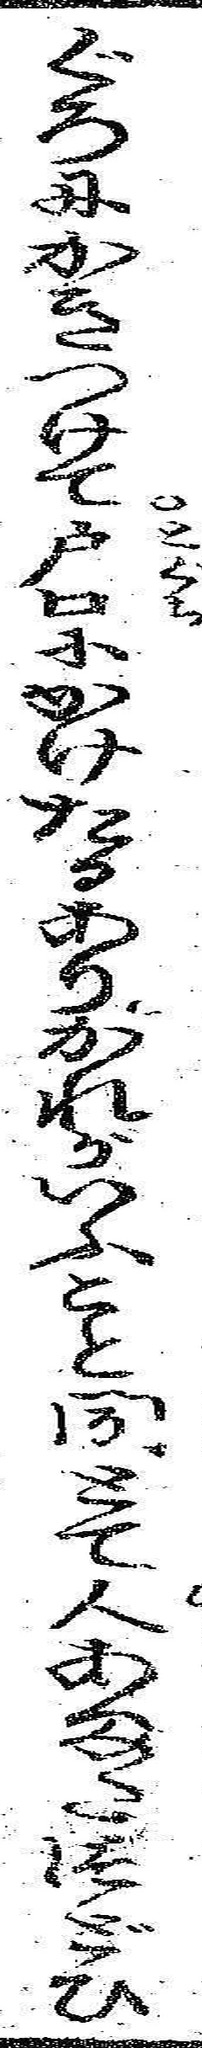ぐろにかきつけて。戸口にかけたるあり。かれがいふこと聞とて人あまたつどひ
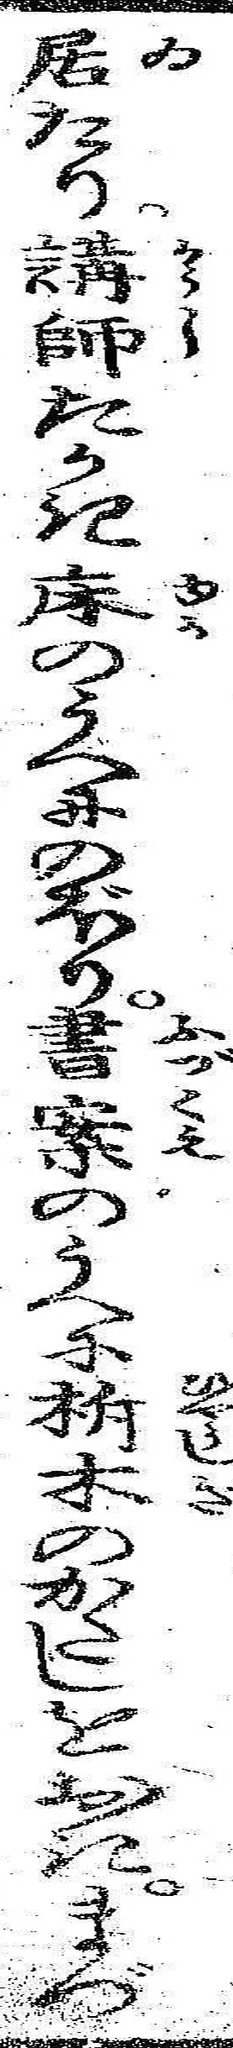居たり。講師たかき床のうへにのぼり。書案のうへに柝木のかたしをおき。まづ
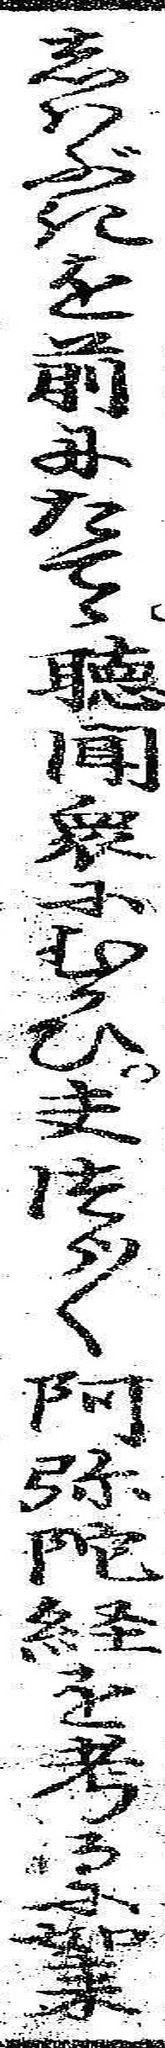しはぶきを前にたてゝ。聴聞衆にむかひ。夫つら〳〵阿弥陀経を考るに如来
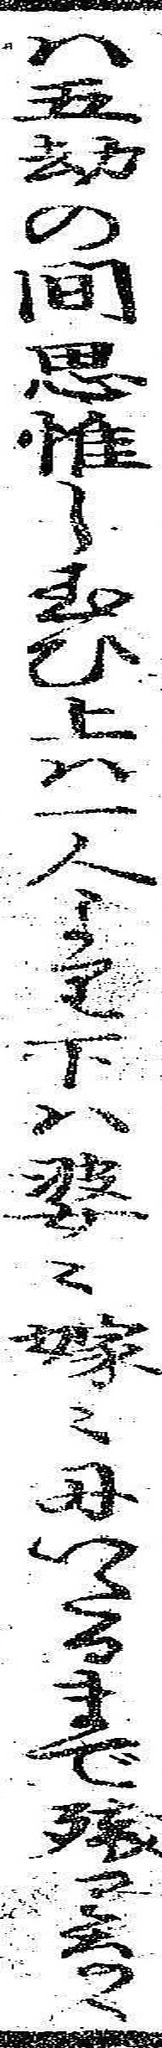は五劫の間思惟し玉ひ。上は一人より下は婆々嫁々にいたるまで。残りなく

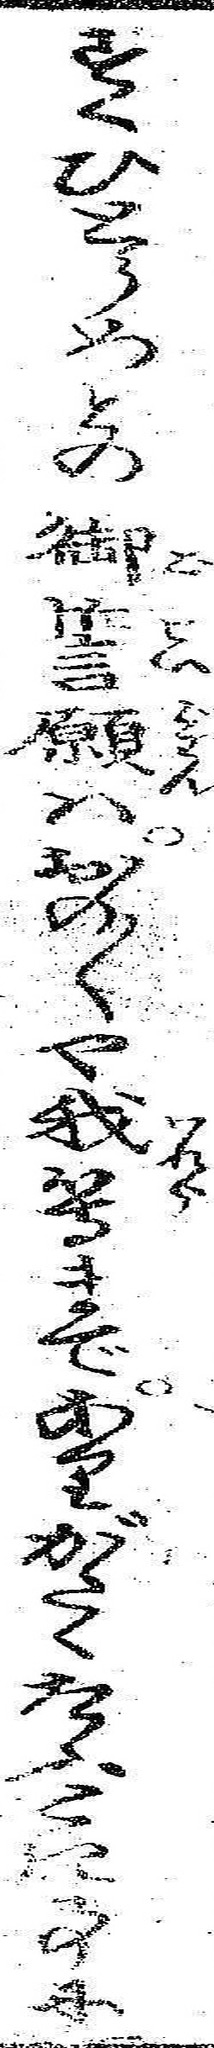すくひとらめとの御誓願は。おの〳〵や我等まで。ありがたくたふとき事に
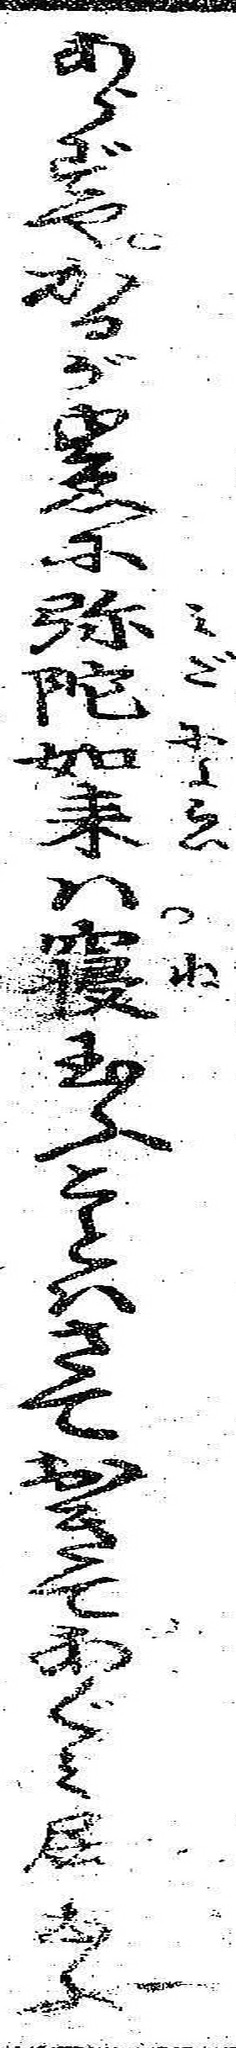あらずや。かるがゆゑに弥陀如来は。寝玉ふことはさておきてあぐみ居玉ふ
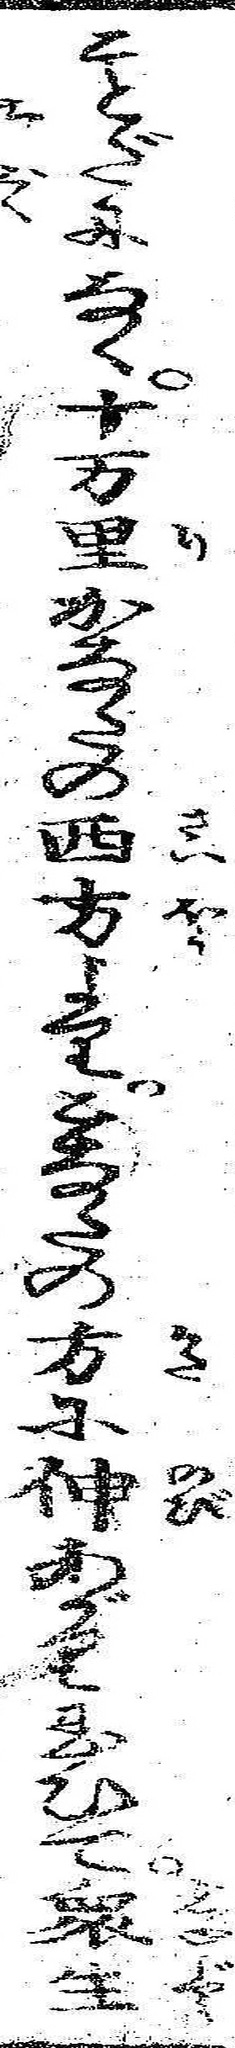ことだになく。十万里かなたの西方より。こなたの方に伸あがり玉ひて。衆生
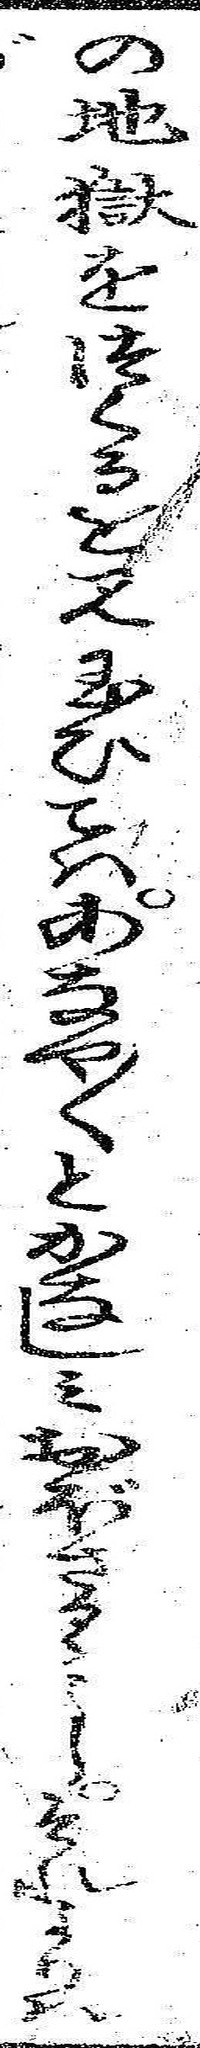の地獄をつくるを見玉ひては。あなや〳〵とかなしみおぼさるゝよし。それよりは
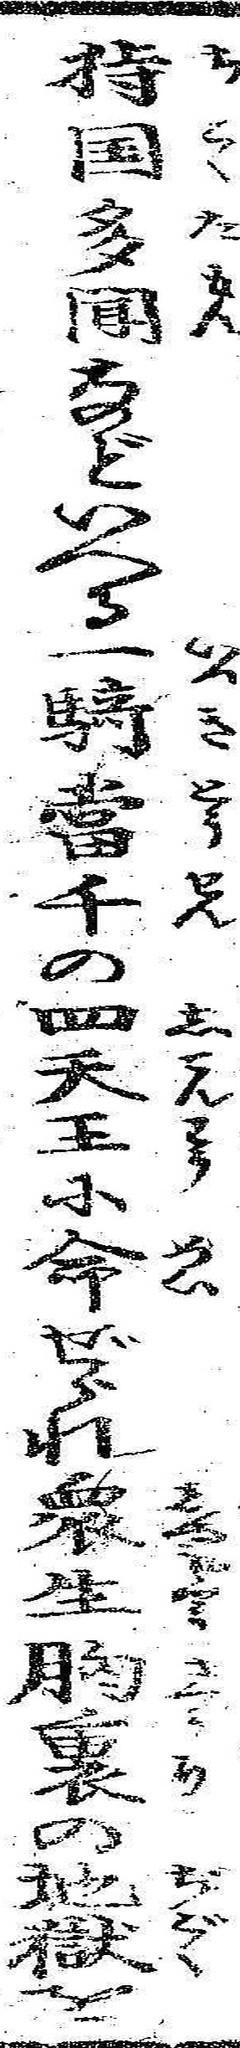持国多聞などいへる一騎当千の四天王に命ぜられ衆生胸裏の地獄を
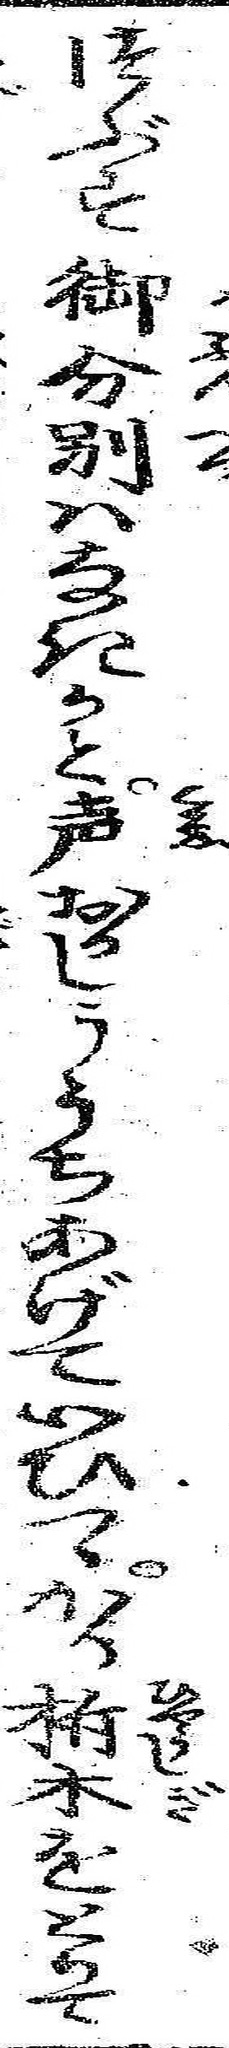つぶす御分別はなきかと。声おかしううちあげていひつゝ。かの柝木をとりて
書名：昔話稲妻表紙
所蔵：国文学研究資料館
